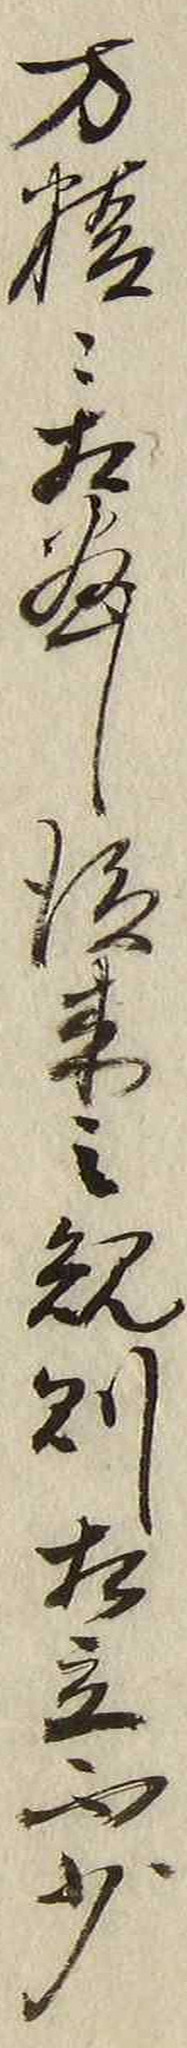方精々相尽し後来之規則相立不少

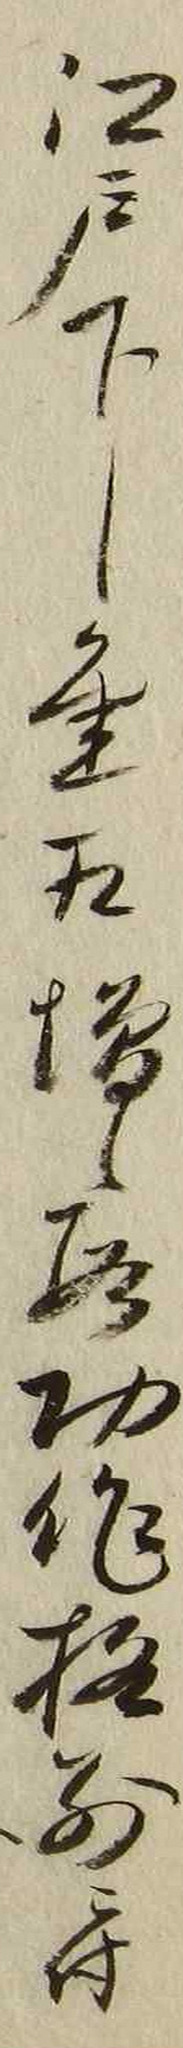江戸下し金相増候段功作格別ニ付
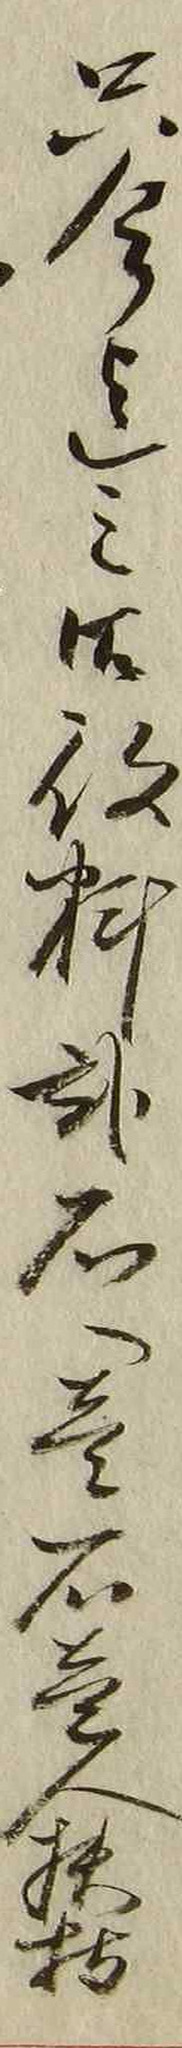只今迄之御役料弐石へ壱石壱人扶持
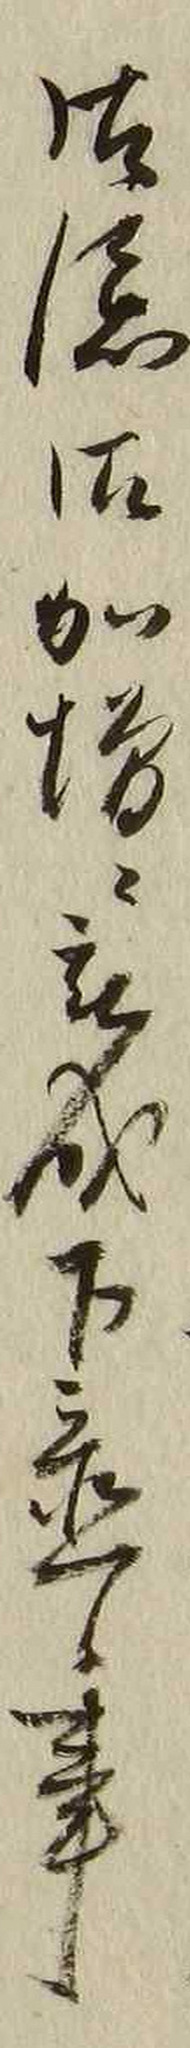御添御加増ニ被成下置候事
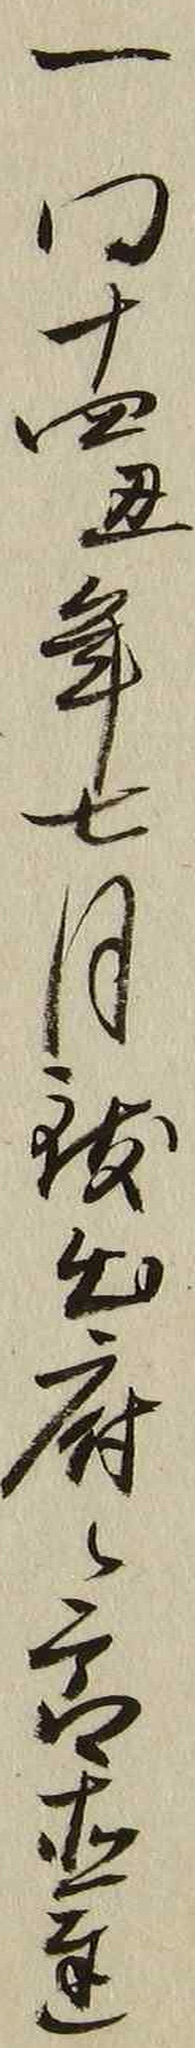一同十四丑年七月致出府候節直達
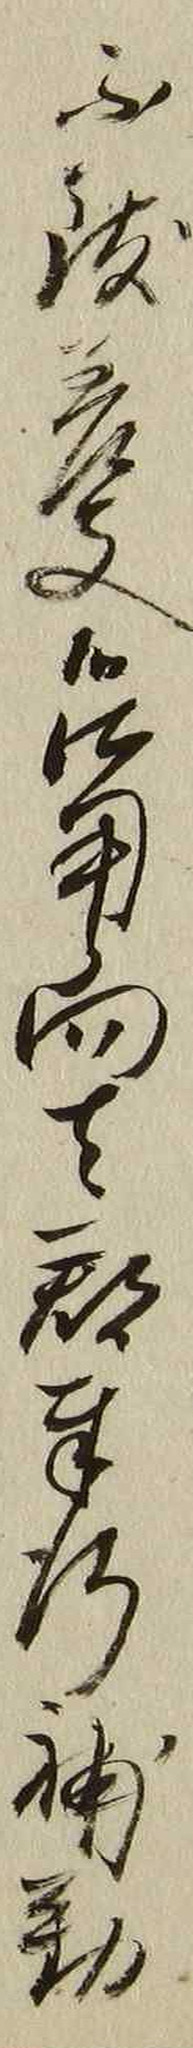不致差支候御用向は郡奉行補勤
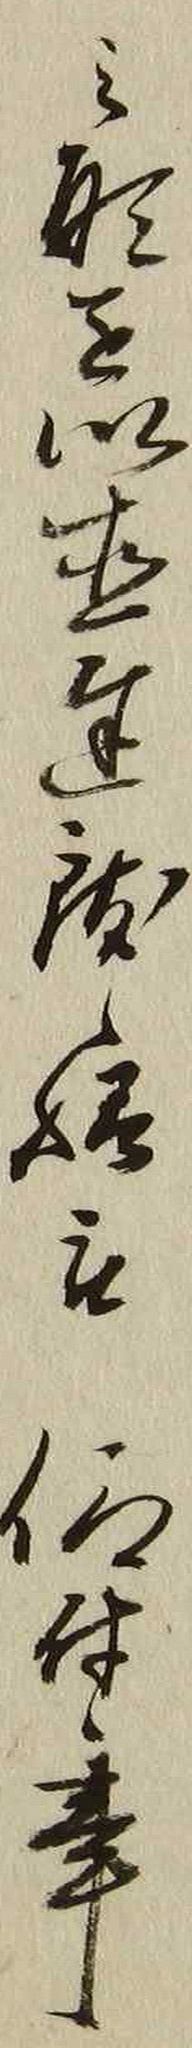之形を以直達致候様被仰付候事
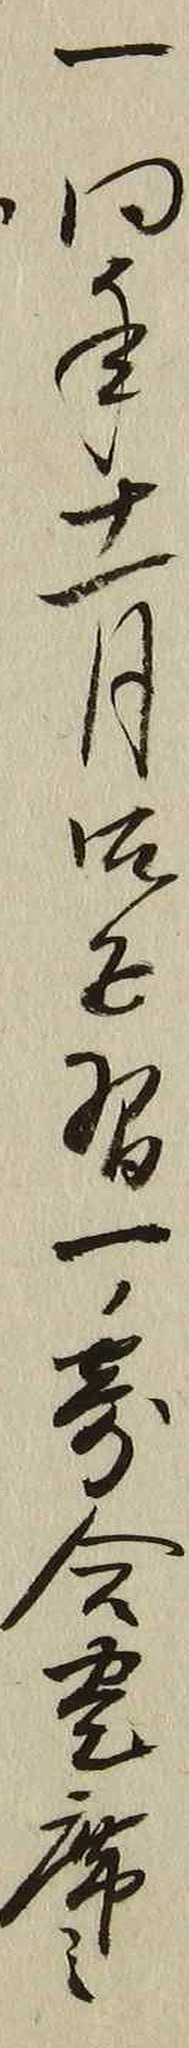一同年十一月御近習一ノ寄合定席之
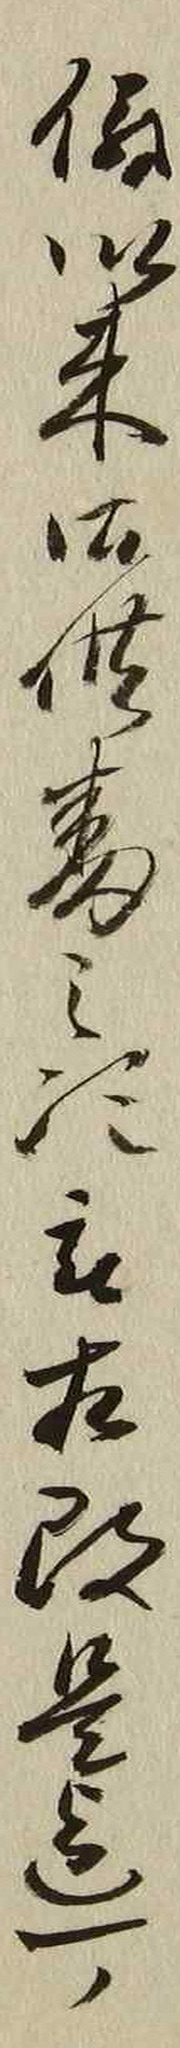儀以来御供番之次被相改是迄一ノ
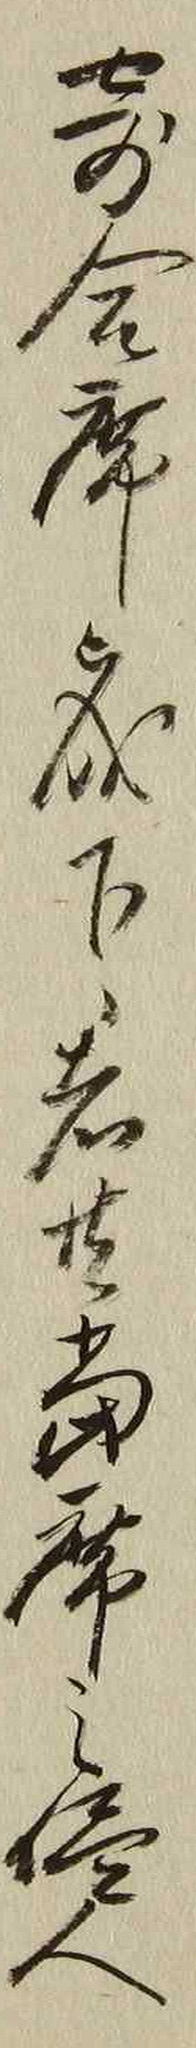寄合席被成下候者共当席之儘人
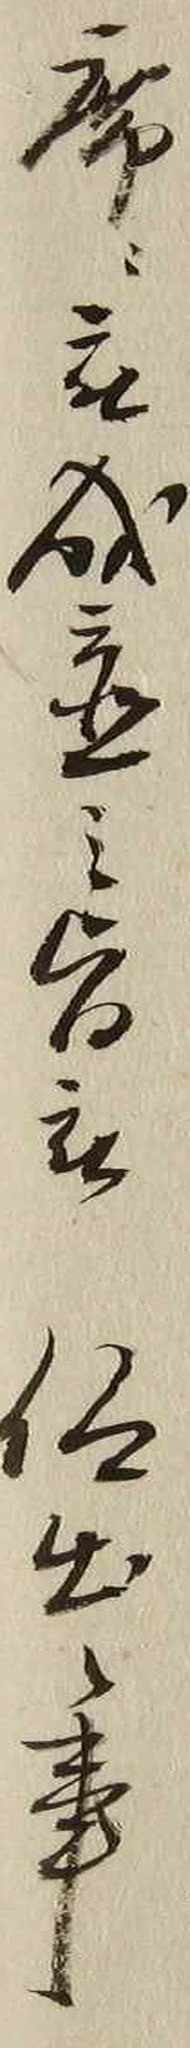席ニ被成置之旨被仰出候事
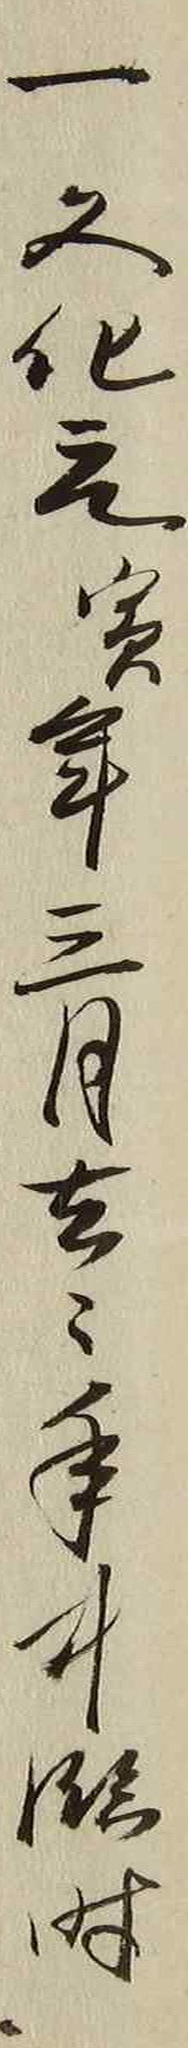一文化元寅年三月去々年中臨時
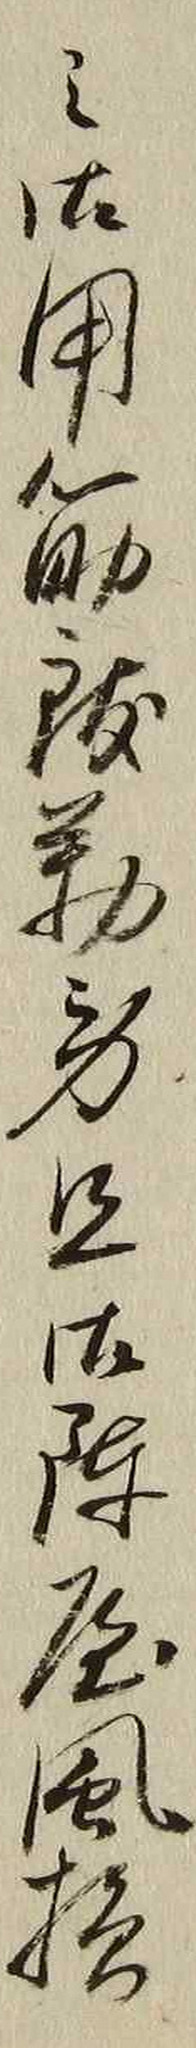之御用筋致勤労且御陣屋風損
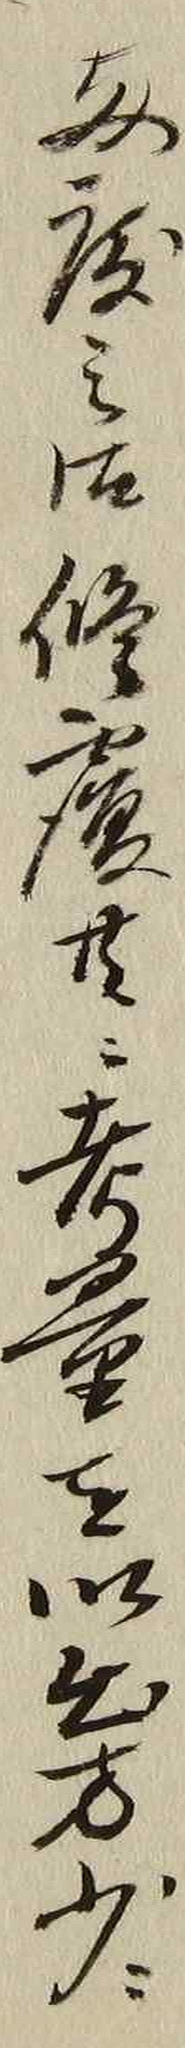両度之御修覆共ニ考量を以出方少ニ
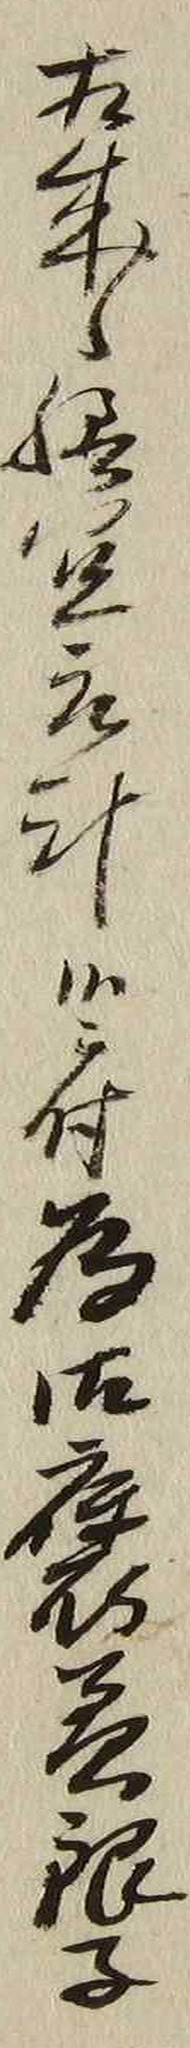相成候様宜取計候ニ付為御褒美銀子
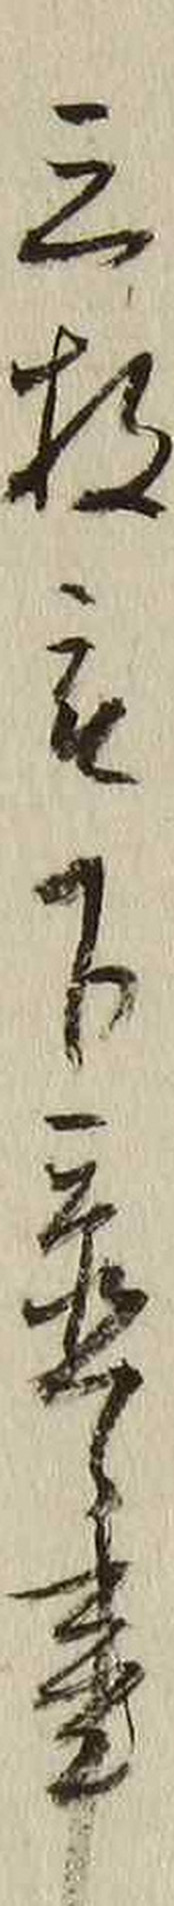三枚被下置候事
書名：諸士系譜　巻之352　す之部2
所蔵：会津若松市立会津図書館
